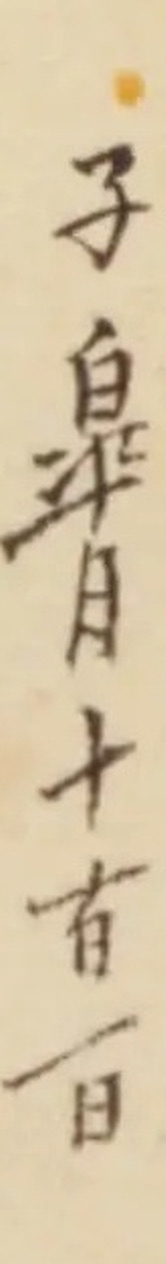子皐月十有一日
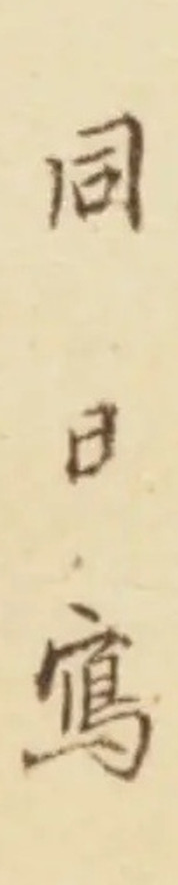同日写
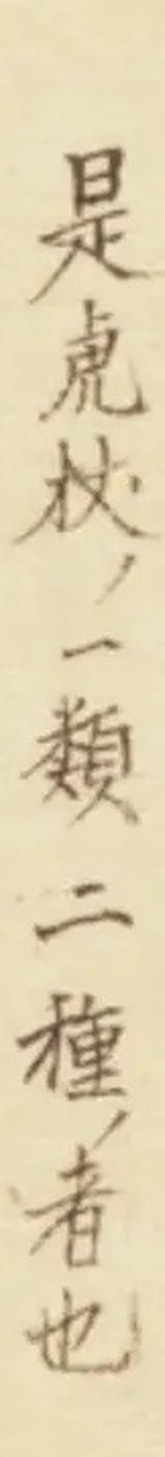是虎杖一類二種者也

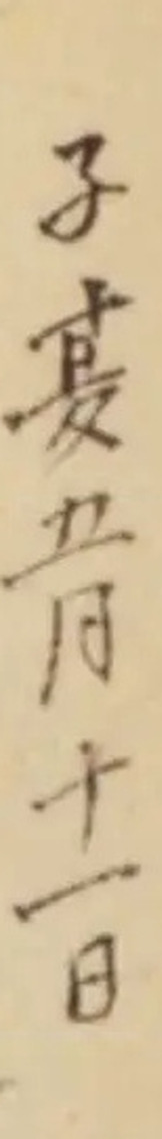子夏五月十一日
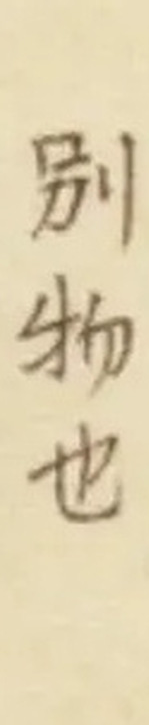別物也

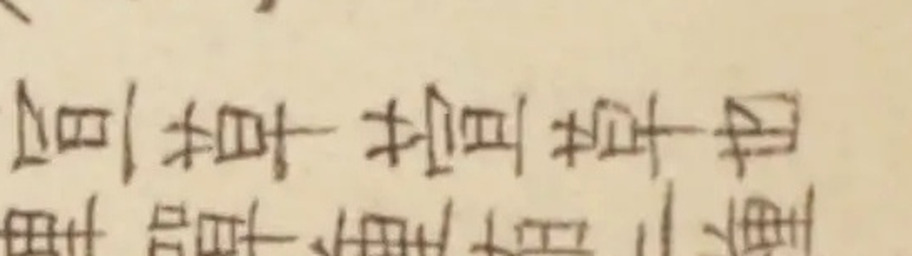即草萱草也
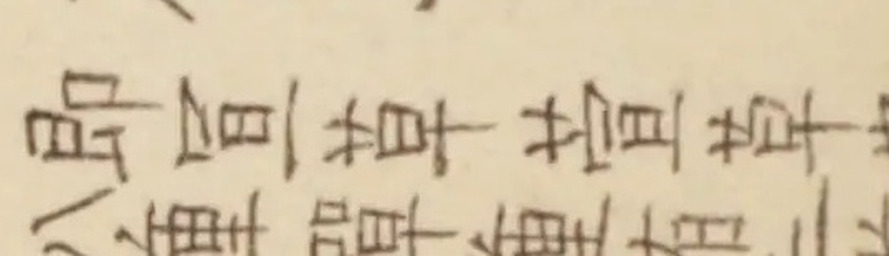即草萱草也
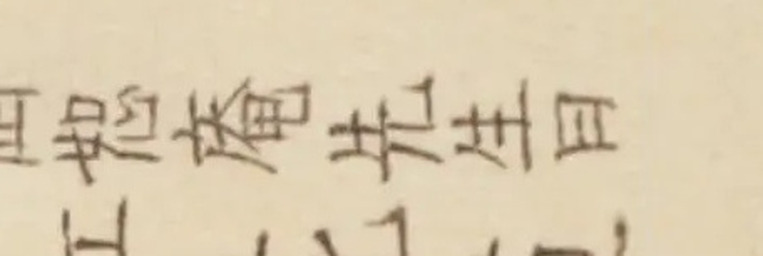松岡恕庵先生曰
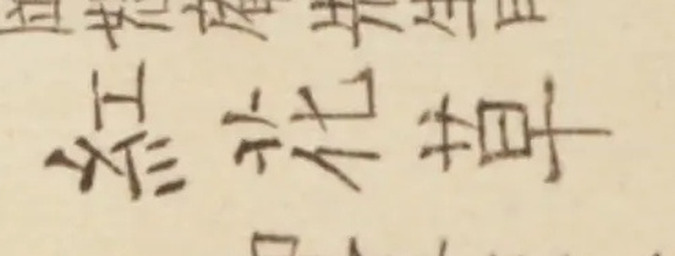紅花草
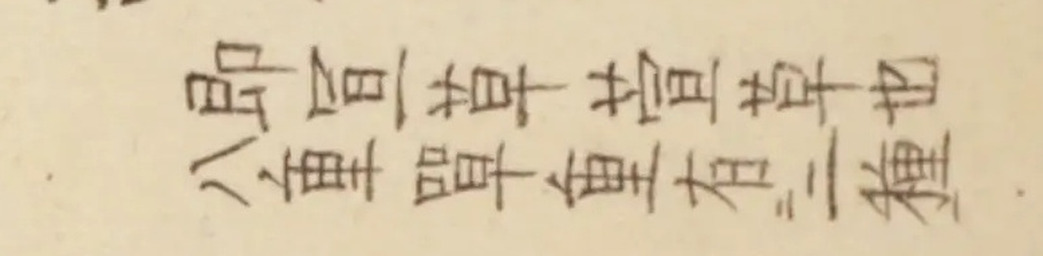即草萱草也
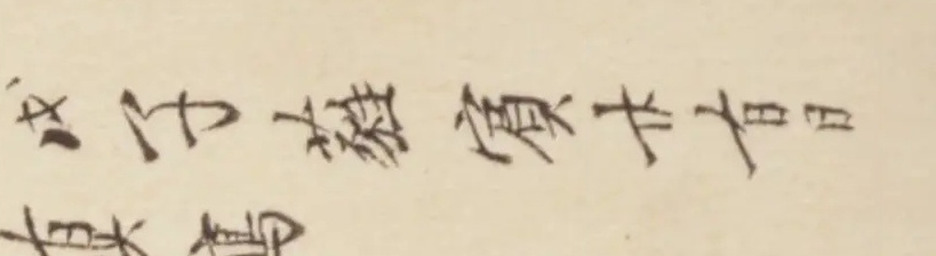戊子蕤賓廿有日
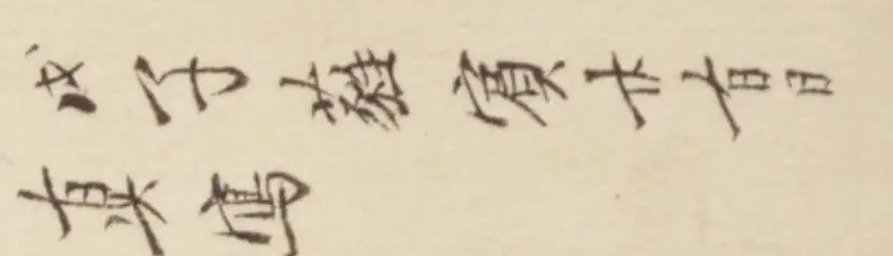戊子蕤賓廿有日
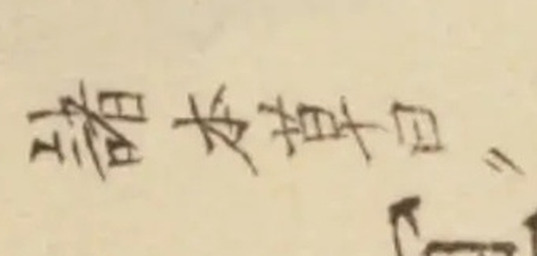諸本草曰

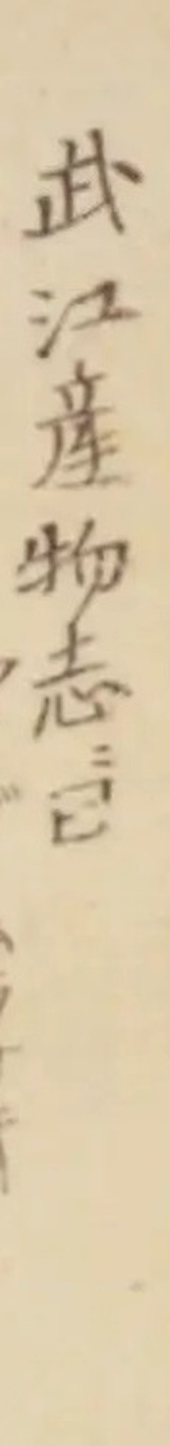武江物産志曰
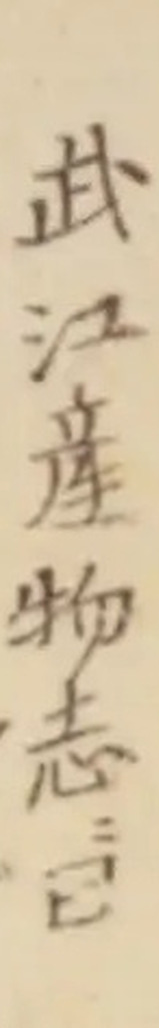武江物産志曰
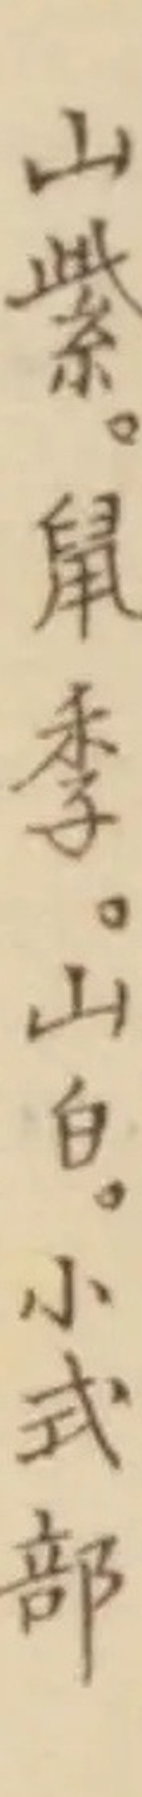山紫。鼠季。山白。小式部
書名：梅園草木花譜夏之部. 4
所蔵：国立国会図書館 National Diet Library, JAPAN
